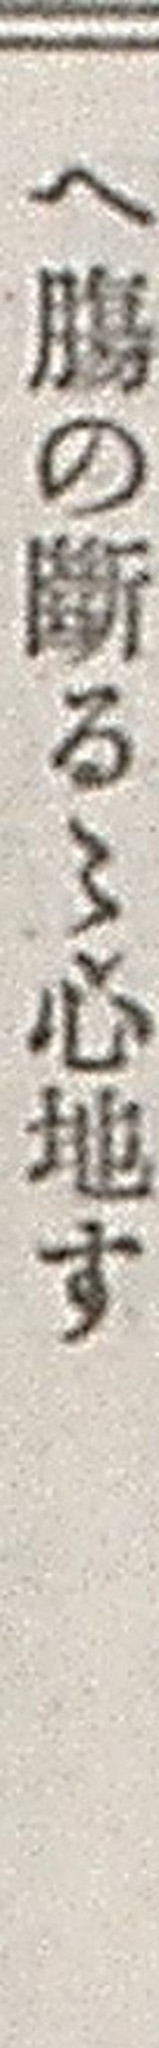へ腸の断る〻心地す
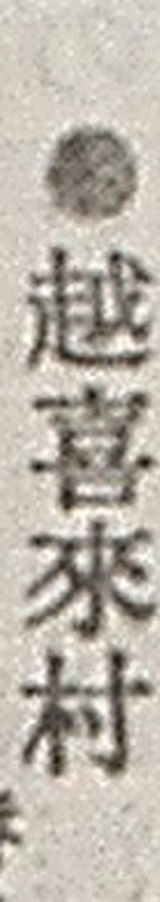●越喜来村
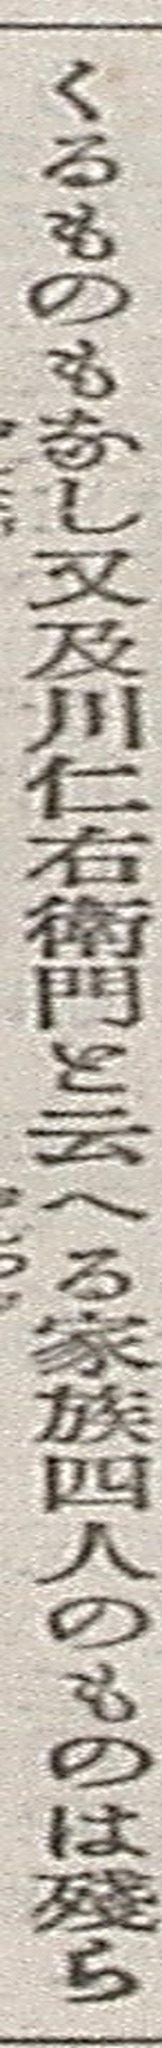くるものもなし又及川仁右衛門と云へる家族四人のものは残ら
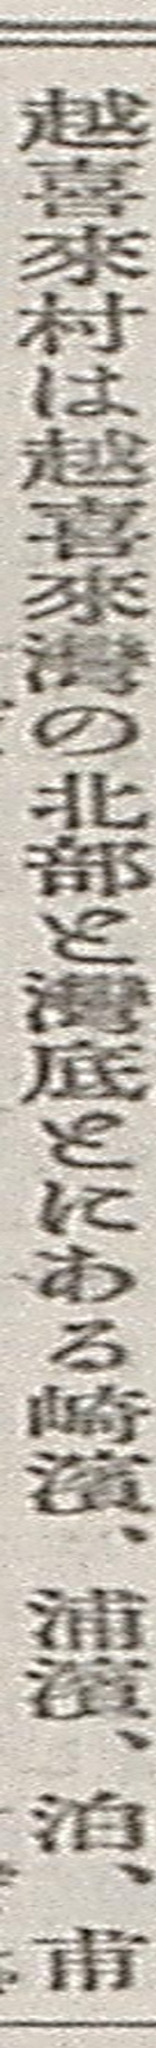越喜来村は越喜来湾の北部と湾底とにある崎浜、浦浜、泊、甫
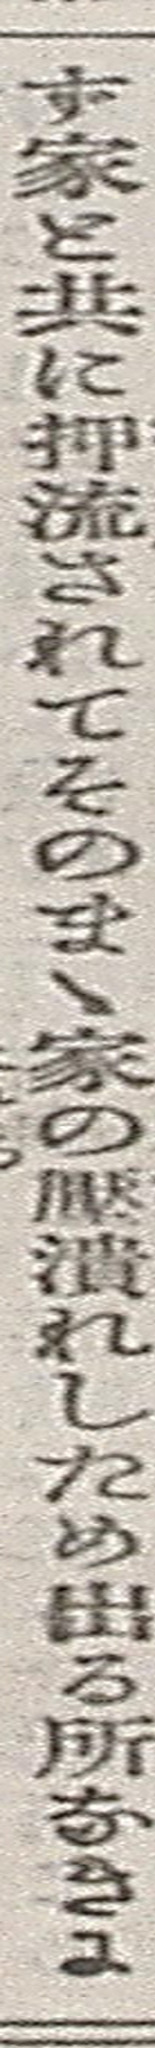ず家と共に押流されてそのまゝ家の圧潰れしため出る所なきに
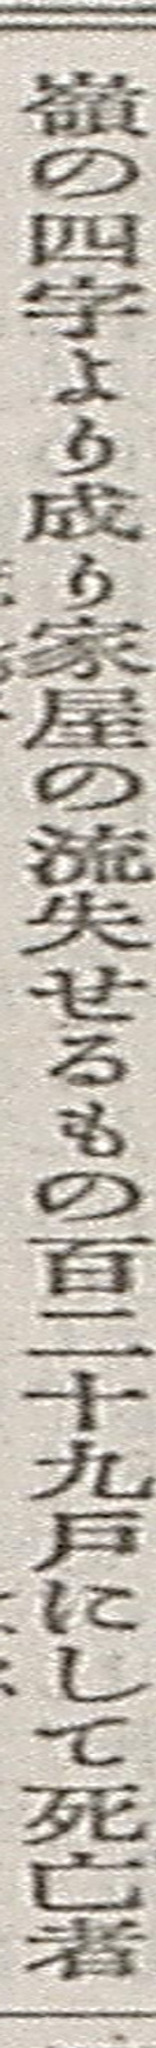嶺の四字より成り家屋の流失せるもの百二十九戸にして死亡者
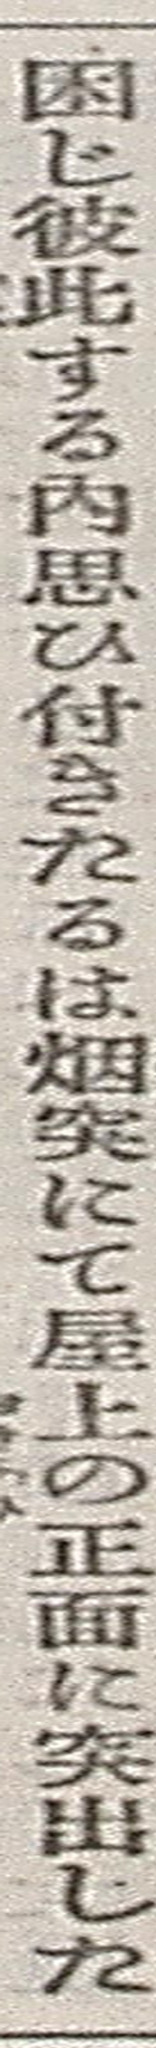困じ彼此する内思ひ付きたるは烟突にて屋上の正面に突出した
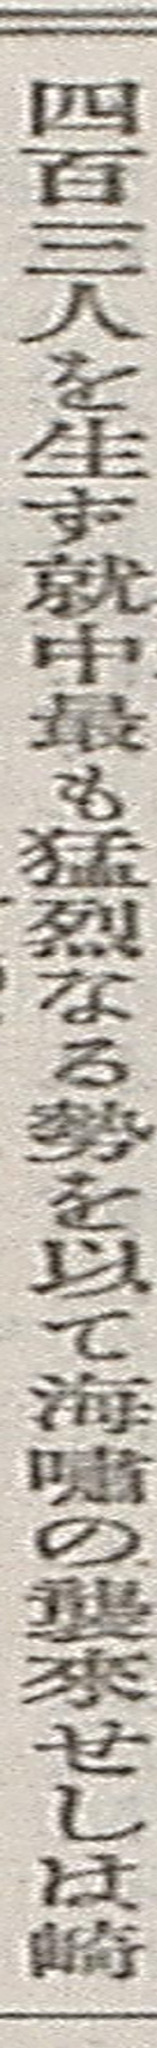四百三人を生ず就中最も猛烈なる勢を以て海嘯の襲来せしは崎
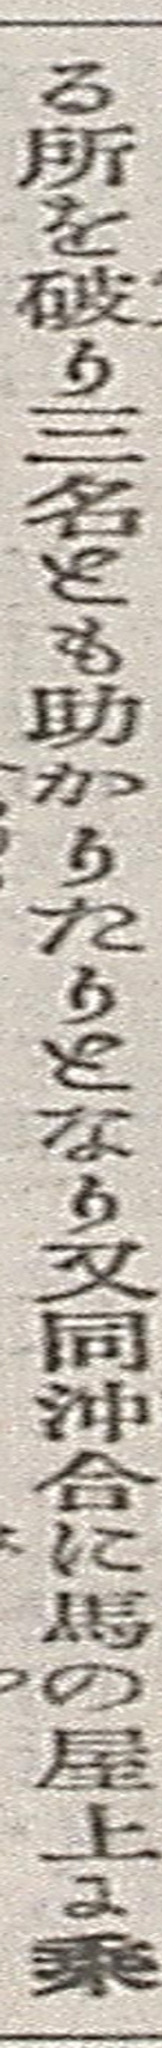る所を破り三名とも助かりたりとなり又同沖合に馬の屋上に乗
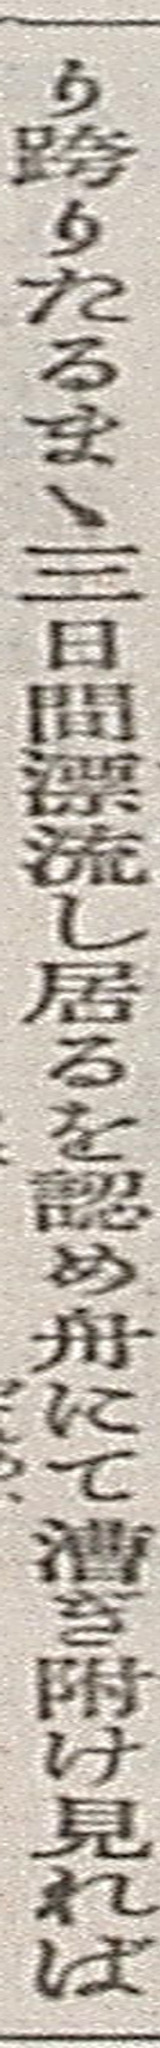り跨りたるまゝ三日間漂流し居るを認め舟にて漕ぎ付け見れば
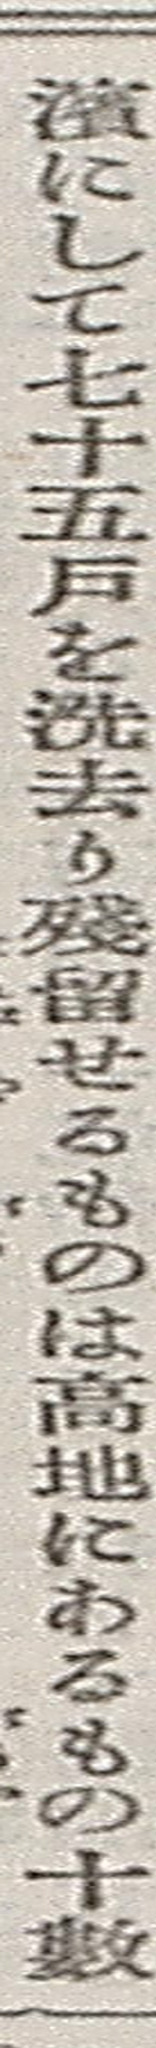浜にして七十五戸を洗去り残留せるものは高地にあるもの十数
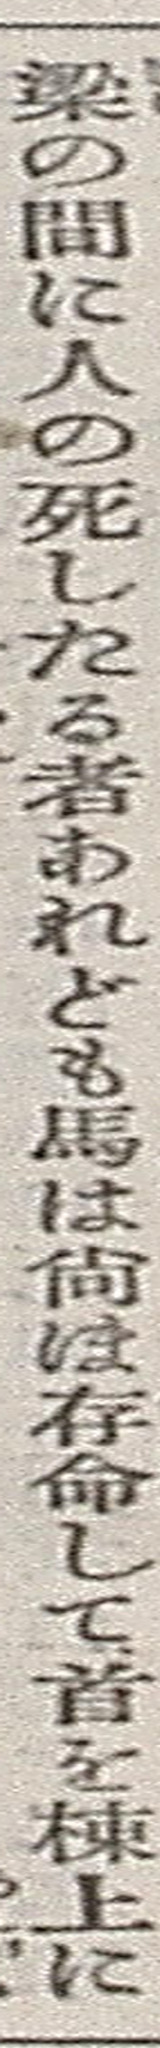梁の間に人の死したる者あれども馬は尚ほ存命して首を棟上に
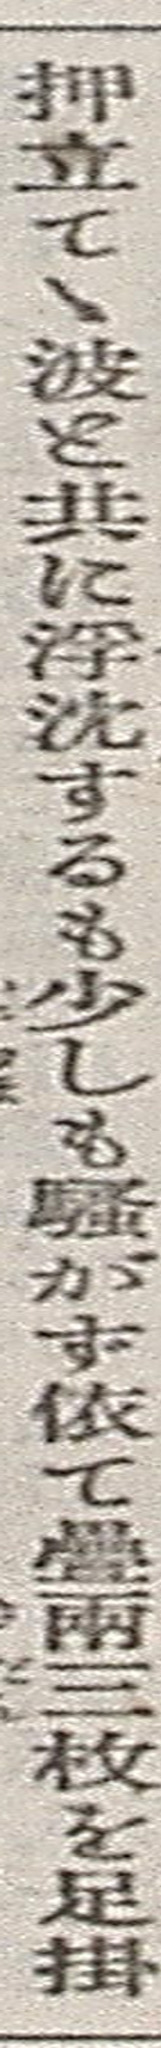押立てゝ波と共に浮沈するも少しも騒がず依て畳両三枚を足掛
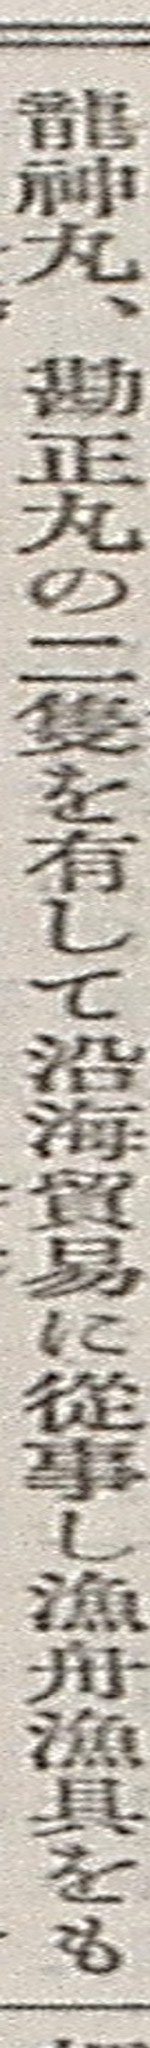龍神丸、勘正丸のニ隻を有して沿海貿易に従事し魚舟漁具をも
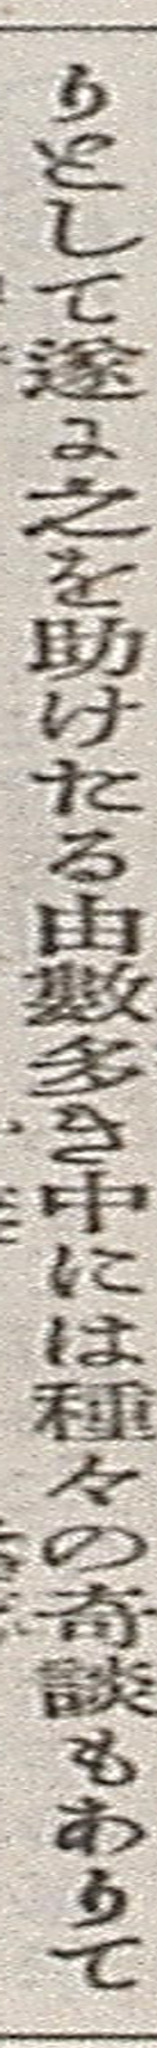りとして遂に之を助けたる由数多き中には種々の奇談もありて
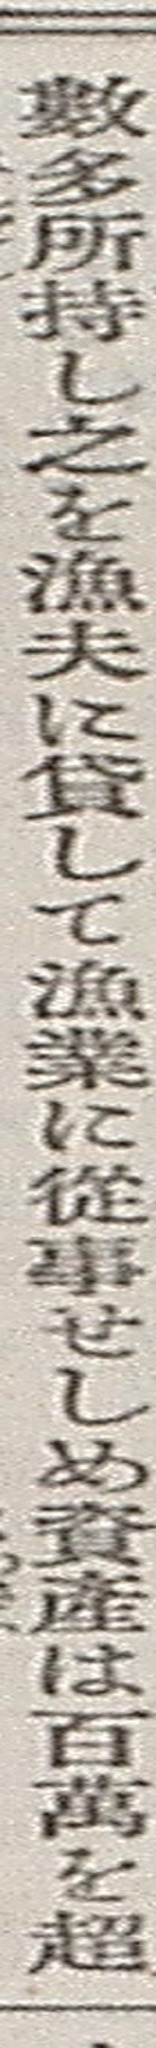数多所持し之を漁夫に貸して漁業に従事せしめ資産は百万を超
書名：風俗畫報臨時増刊第百十九號　大海嘯被害録（中）
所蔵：東京大学地震研究所図書室 Earthquake Research Institute Library, The University of Tokyo, JAPAN
